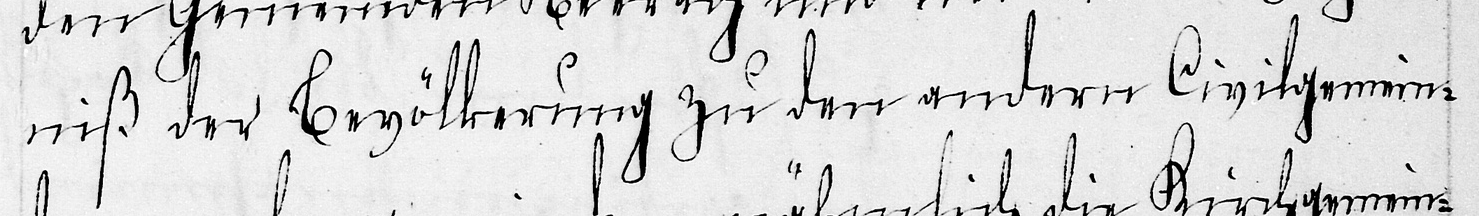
niße der Bevölkerung zu den andern Civilgemein¬
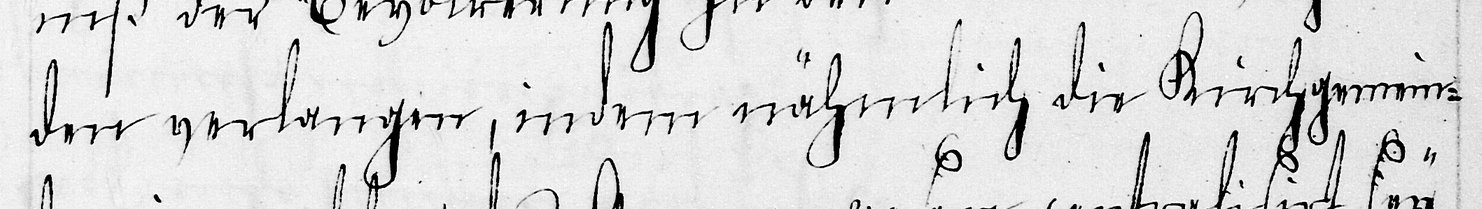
den verlangen, indem nähmlich die Kirchgemein¬
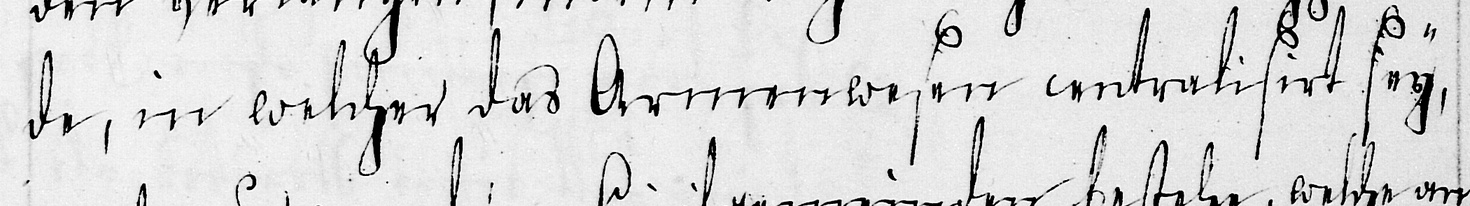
de, in welcher das Armenwesen centralisirt sey,
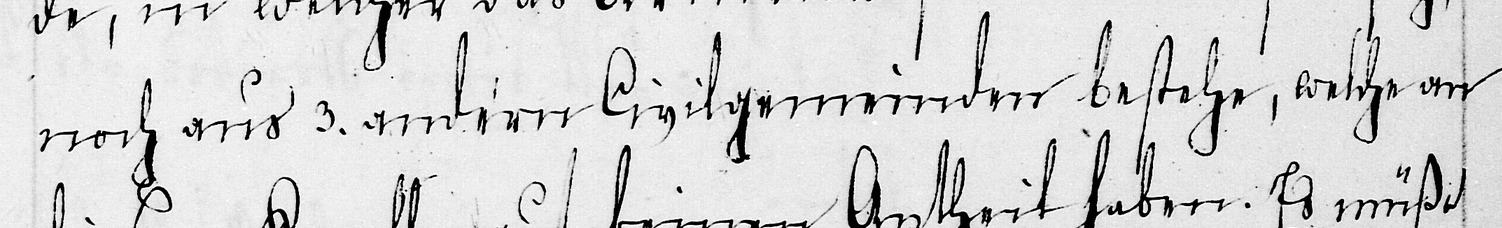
noch aus 3. andern Civilgemeinden bestehe, welche an
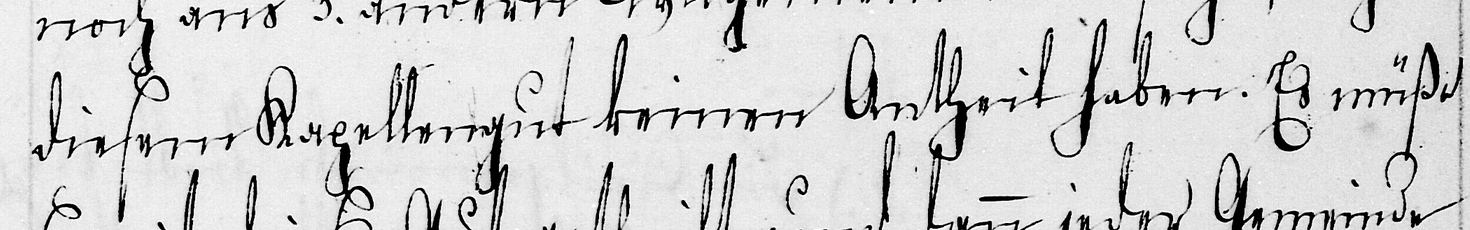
diesem Kapellengut keinen Antheil haben. Es müße
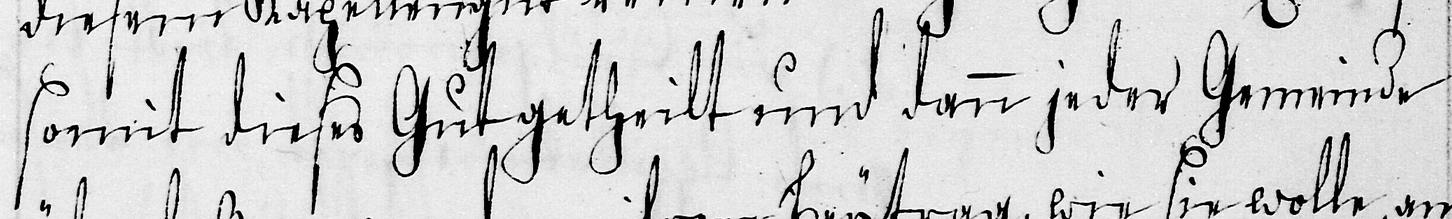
somit dieses Gut getheilt und dann jeder Gemeinde
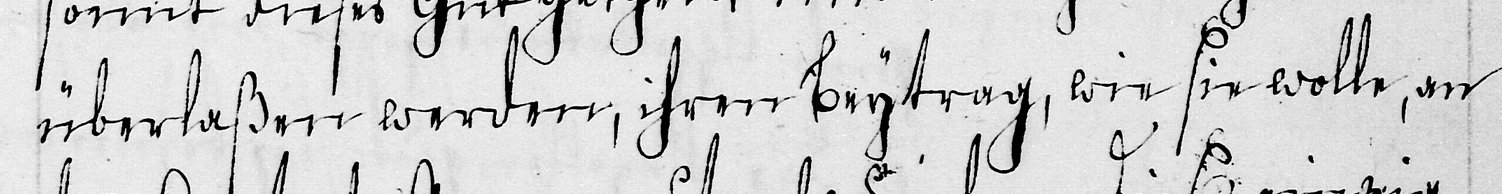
überlaßen werden, ihren Beytrag, wie sie wolle, an
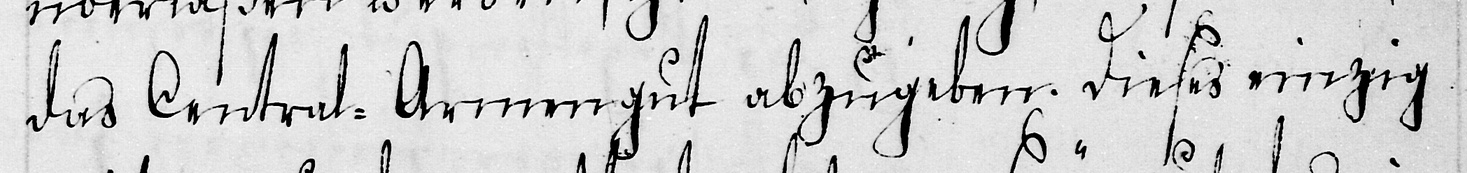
das Central-Armengut abzugeben. Dieses einzig
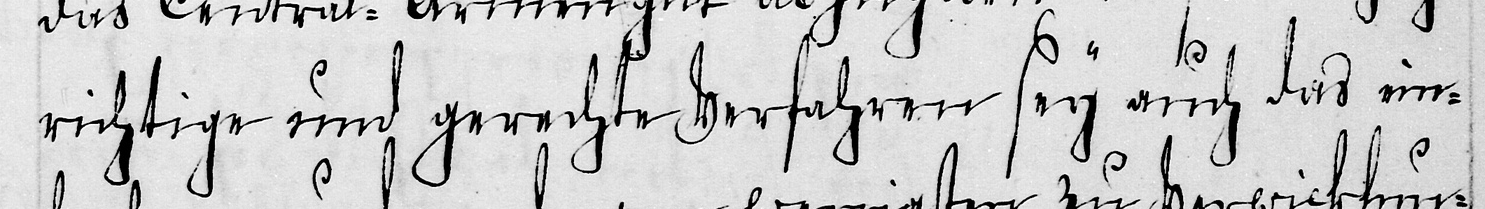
richtige und gerechte Verfahren sey auch das ein¬
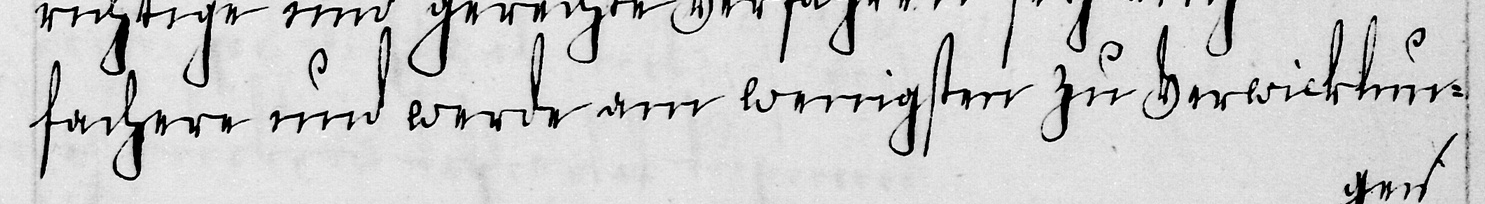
fachere und werde am wenigsten zu Verwicklun-
